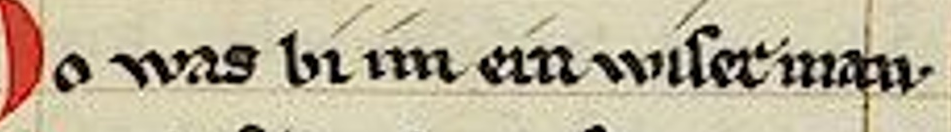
*Do was bi im ein wiſer man.
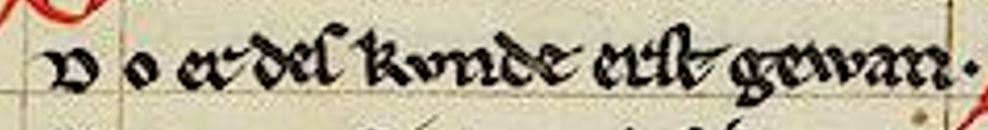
Do er deſ kvnde erſt gewan.
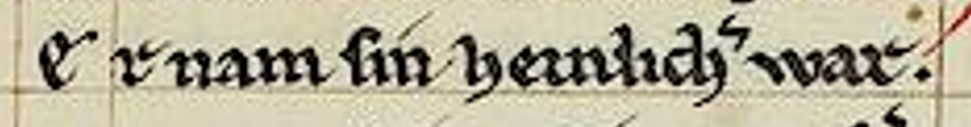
Er nam ſin heinlich(er) war.
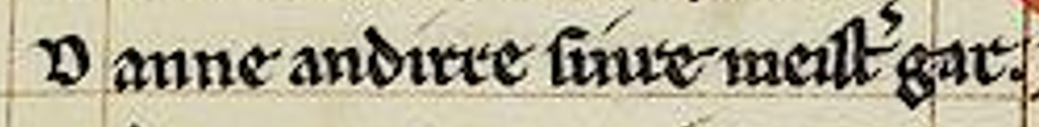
Danne andirre ſinre meiſt(er) gar.
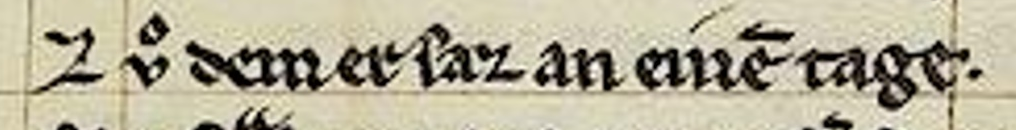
Zv°o dem er ſaz an eine(m) tage.
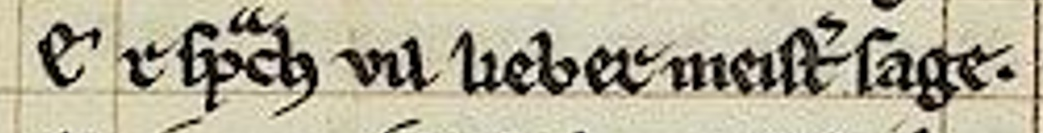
Er sp(ra)ch vil lieber meiſt(er) ſage.
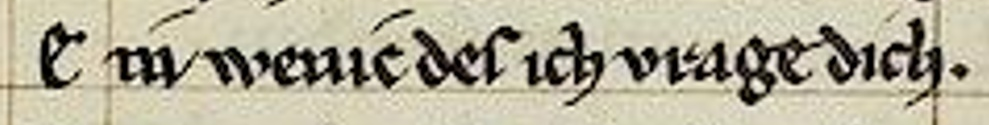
Ein wenic deſ ich vrage dich.
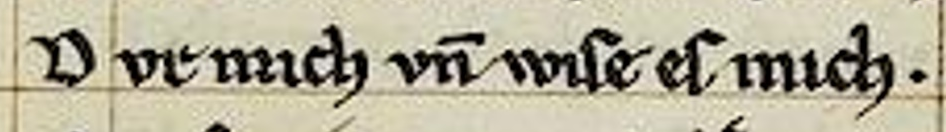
Dvr mich vn(d) wiſe eſ mich.
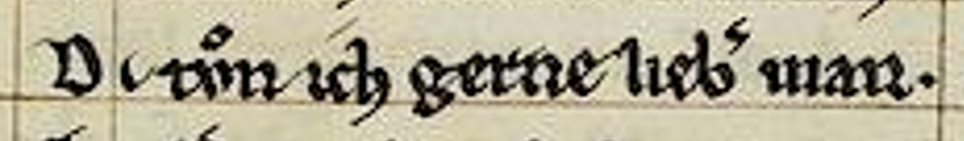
D(az) tv°on ich gerne lieb(er) man.
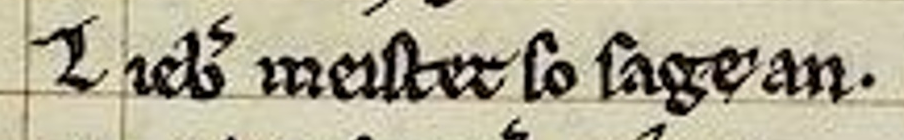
Lieb(er) meiſter ſo ſage an.
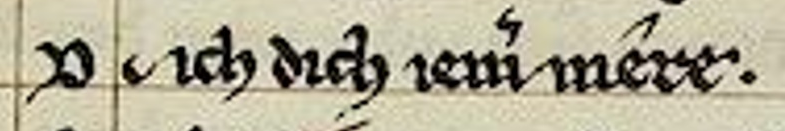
D(az) ich dich iem(er) mere.
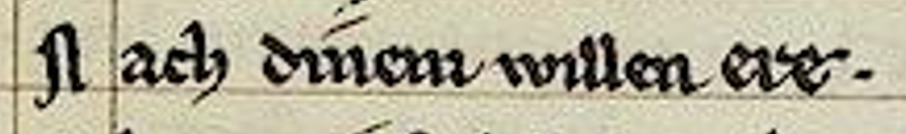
Nach dinem willen ere.
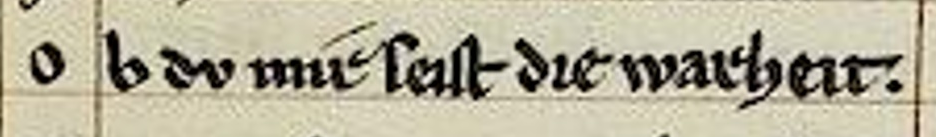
Ob dv mir ſeiſt die warheit.
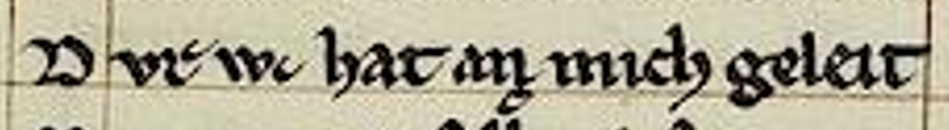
Dvr w(az) hat an mich geleit
